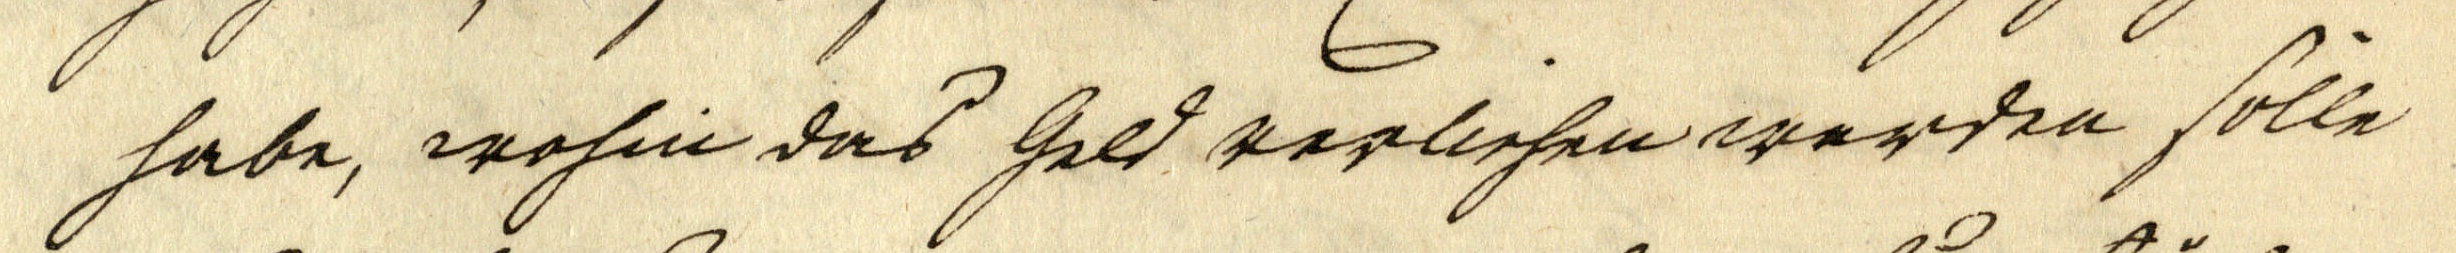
habe, wohin das Geld verliehen werden solle
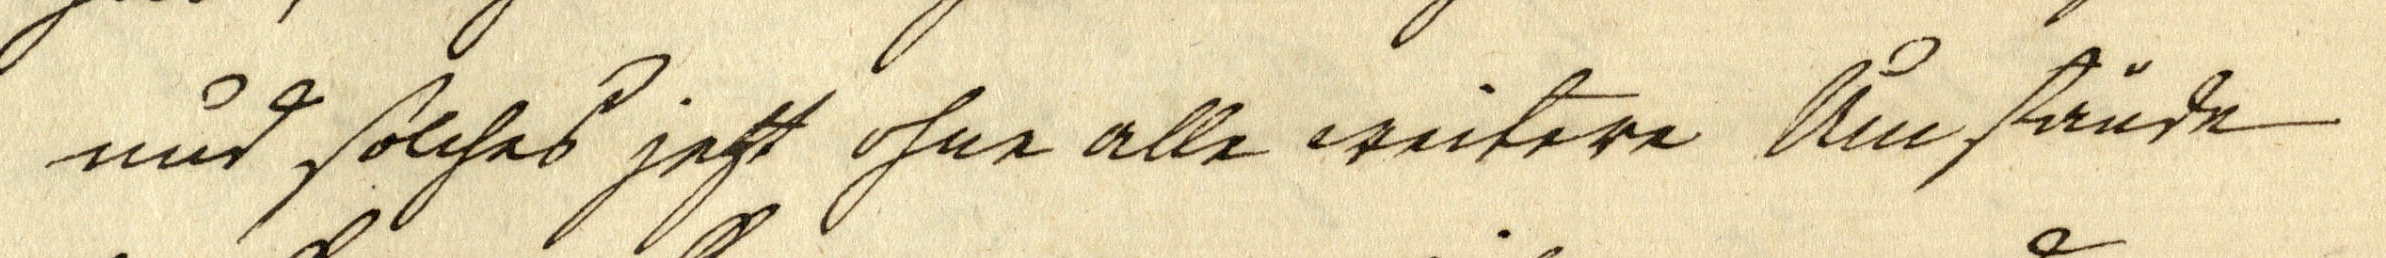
und solches jetzt ohne alle weitern Umstände
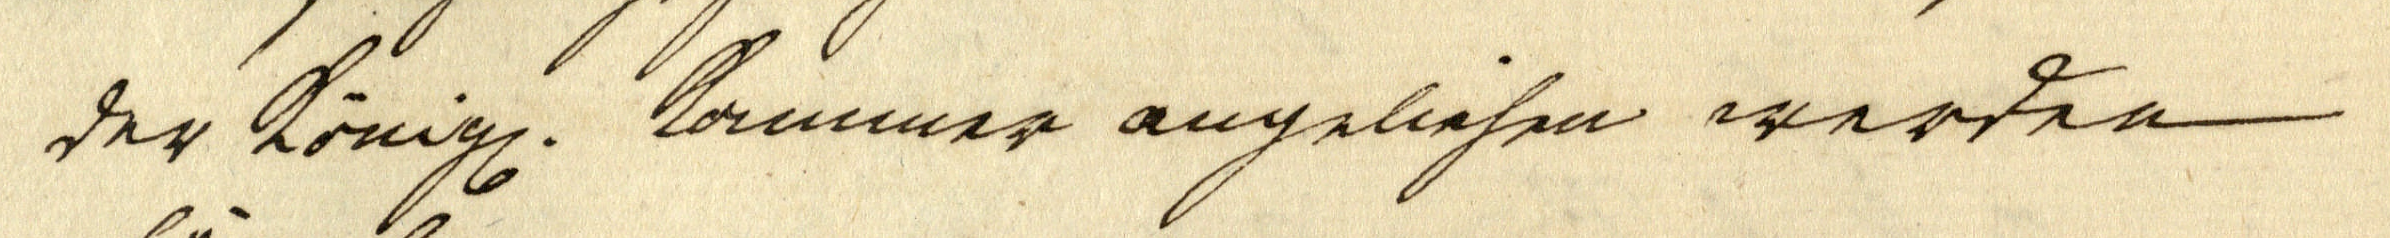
der Königl. Kammer angeliehen werden
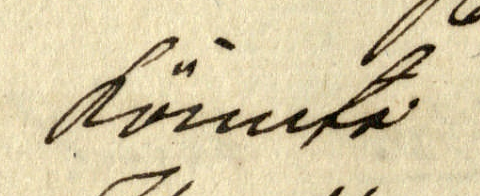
könnte
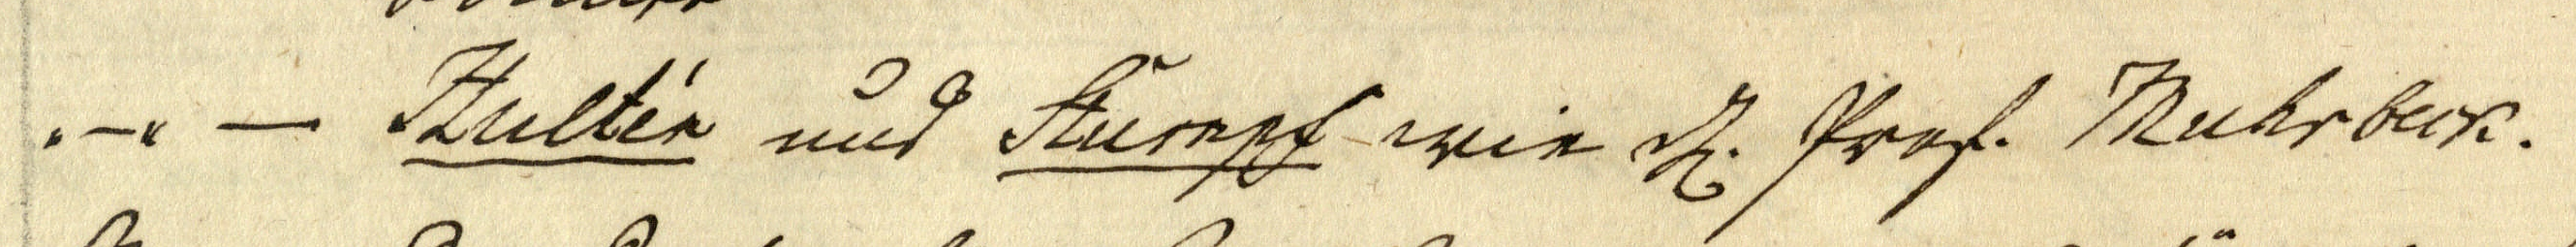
" - " - Hultén und Stumpf wie dh. Prof. Muhrbeck.
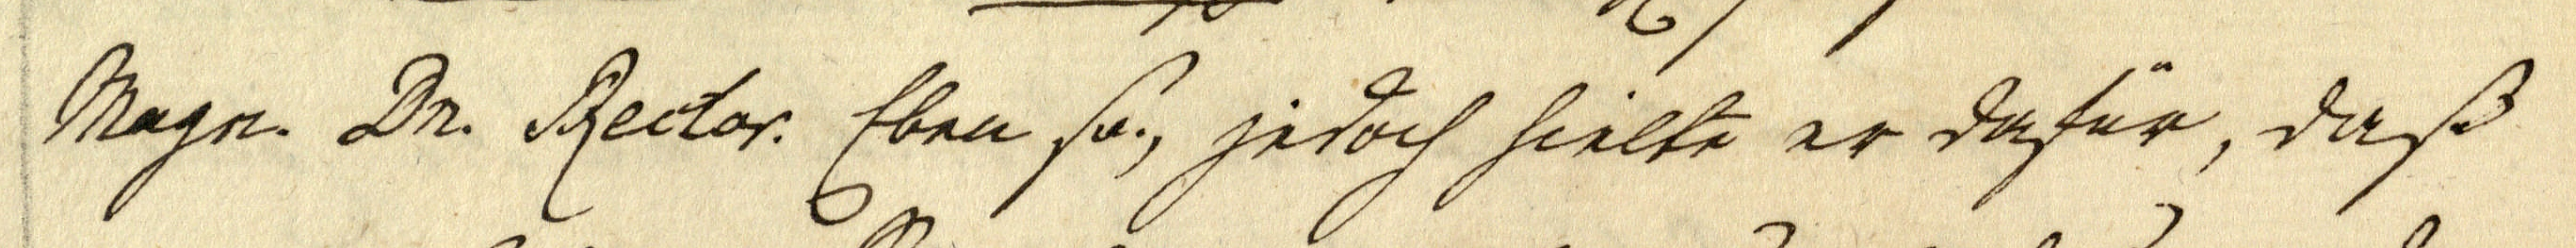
Magn. Dn. Rector. Eben so., jedoch hielte er dafür, daß
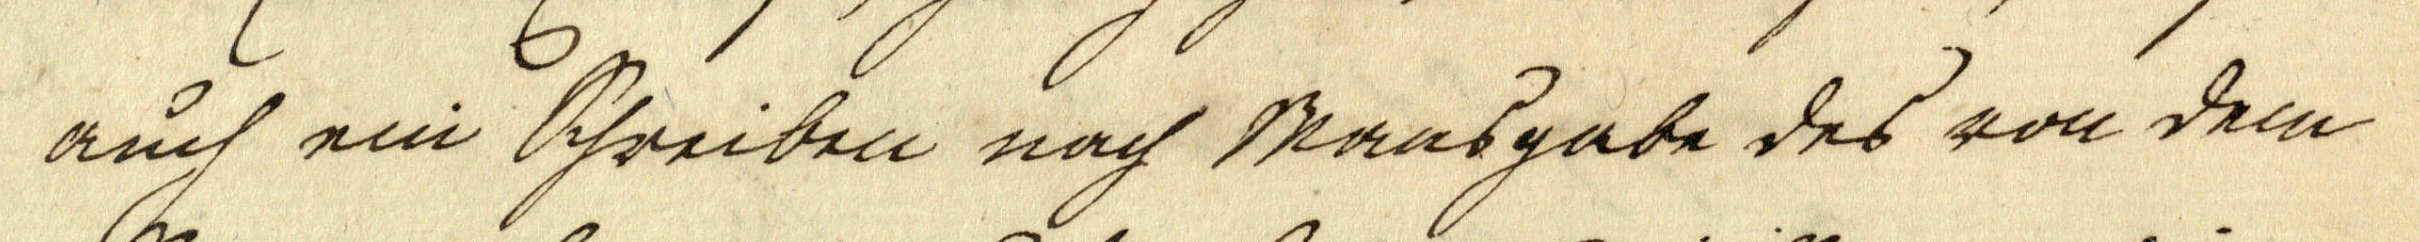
auch ein Schreiben nach Maasgabe des von dem
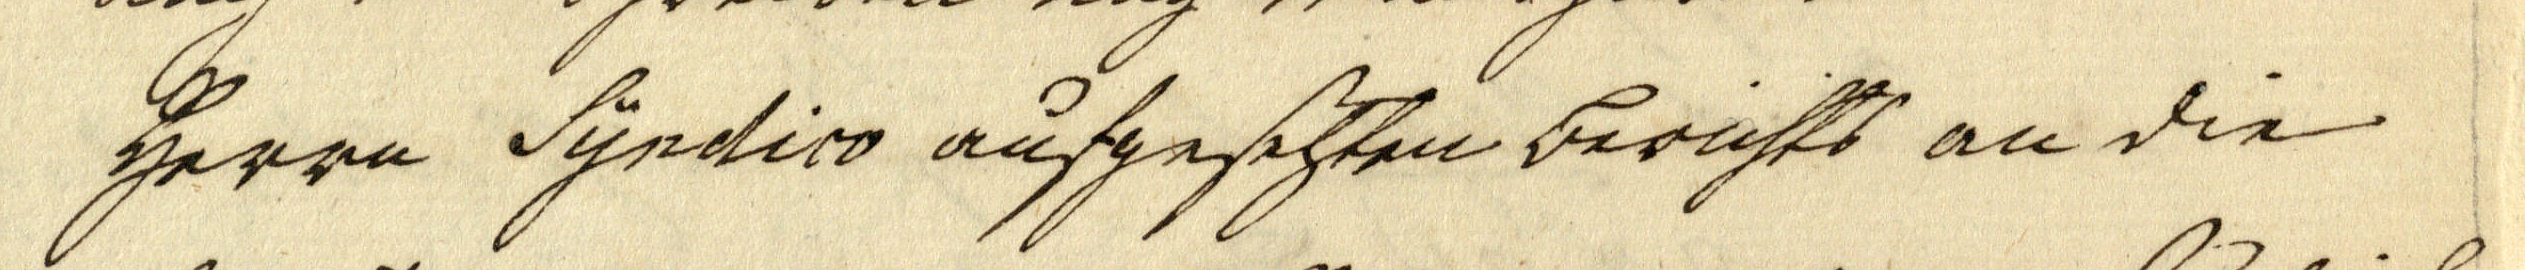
Herrn Syndico aufgesetzten Berichts an die
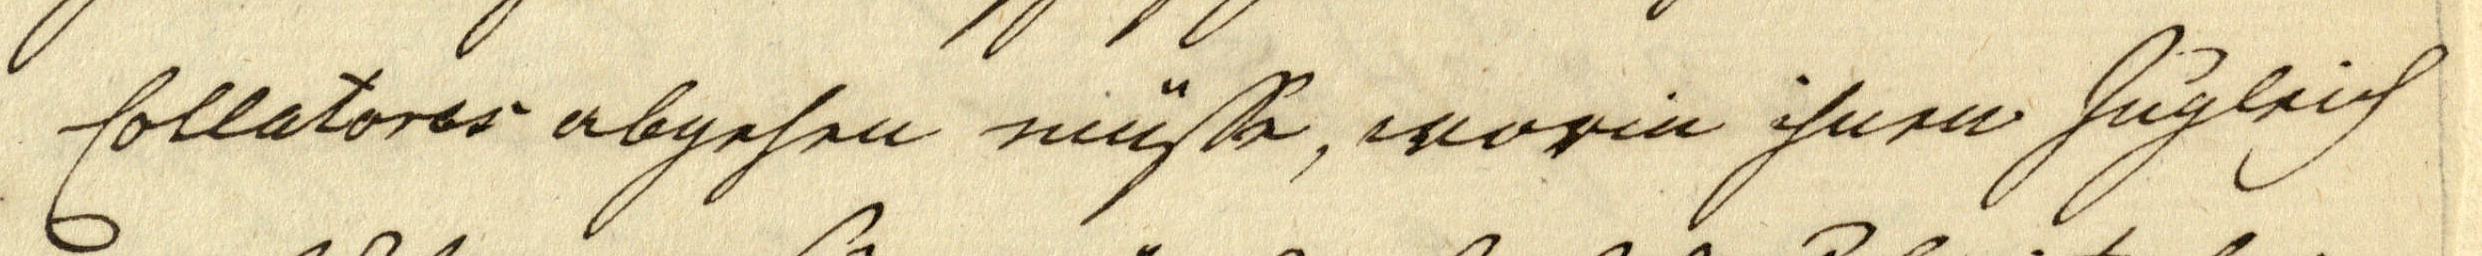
Collatores abgehen müsse, worin ihnen zugleich
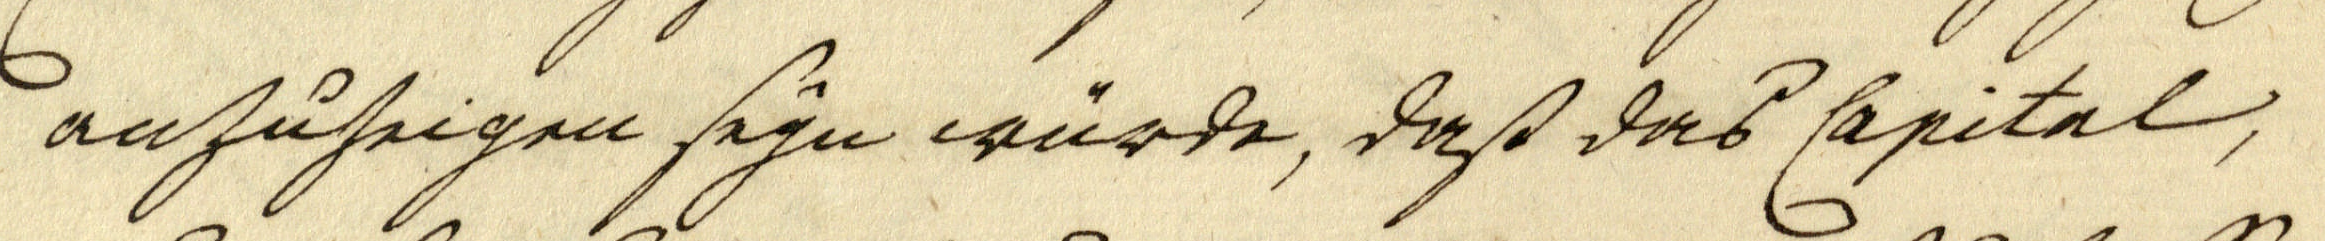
anzuzeigen seyn würde, daß das Capital,
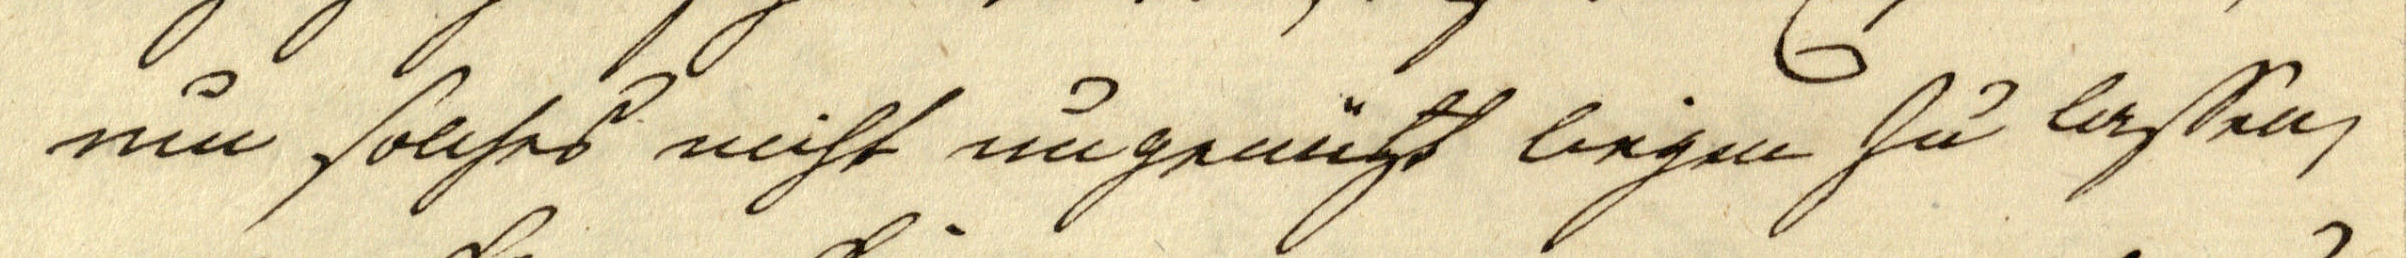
um solches nicht ungenützt liegen zu lassen,
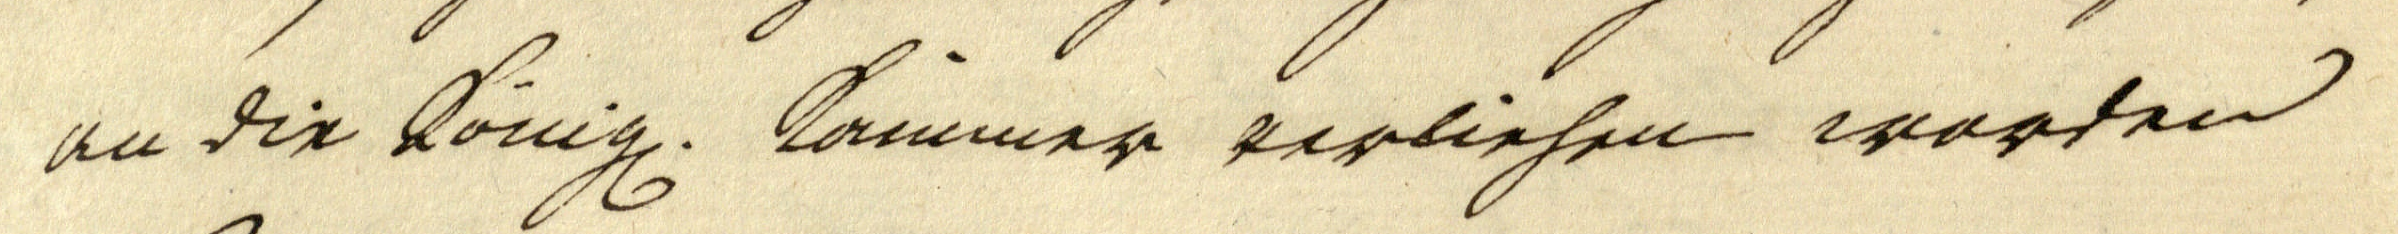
an die Königl. Kammer verliehen worden
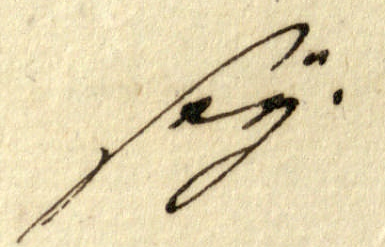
sey.
